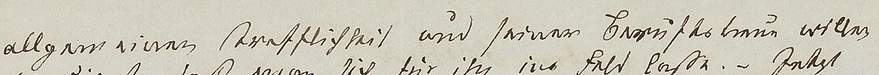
allgemeinen Trefflichkeit und seiner Berufestreue willen
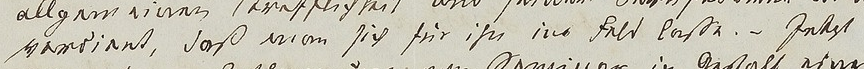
verdient, daß man sich für ihn ins Feld lasse. – Jetzt
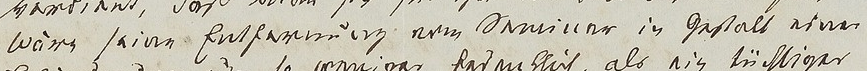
wäre seine Entfernung vom Seminar in Gestalt einer
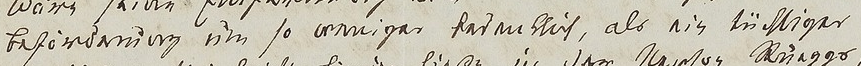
Beförderung um so weniger bedenklich, als ein tüchtiger
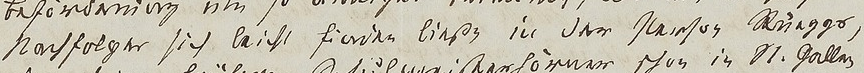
Nachfolger sich leicht finden ließe in der Person Rüeggs,
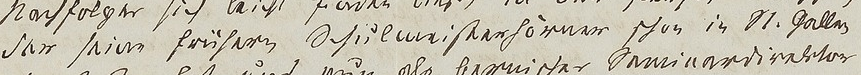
der seine frühern Schulmeisterhörner schon in St. Gallen
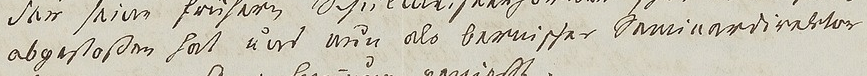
abgestoßen hat und nun als bernischer Seminardirektor
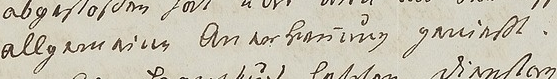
allgemeine Anerkennung genießt.
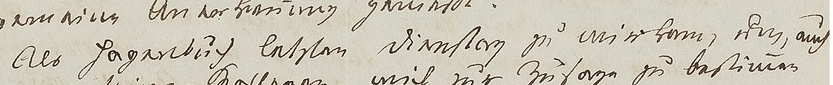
Als Hagenbuchletzten Dienstag zu mir kam, um, auch
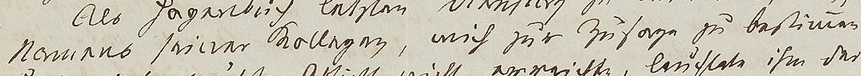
Namens seiner Kollegen, mich zur Zusage zu bestimmen
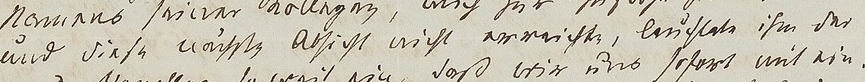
und diese nächste Absicht nicht erreichte, leuchtete ihm der
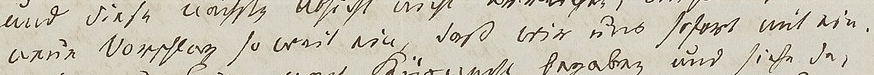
neue Vorschlag so weit ein, daß wir uns sofort mit ein-
